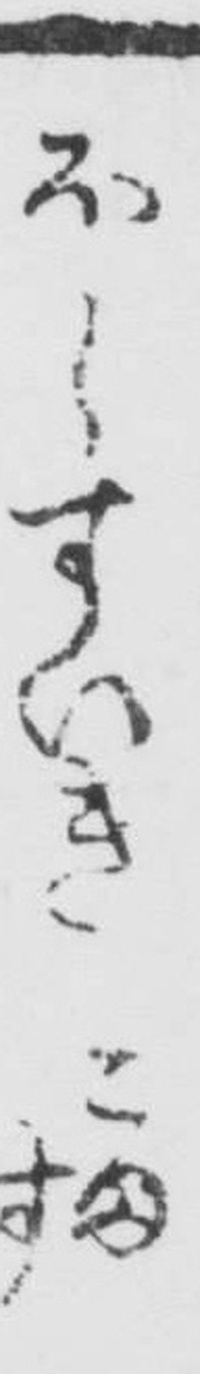ほしすいきこます

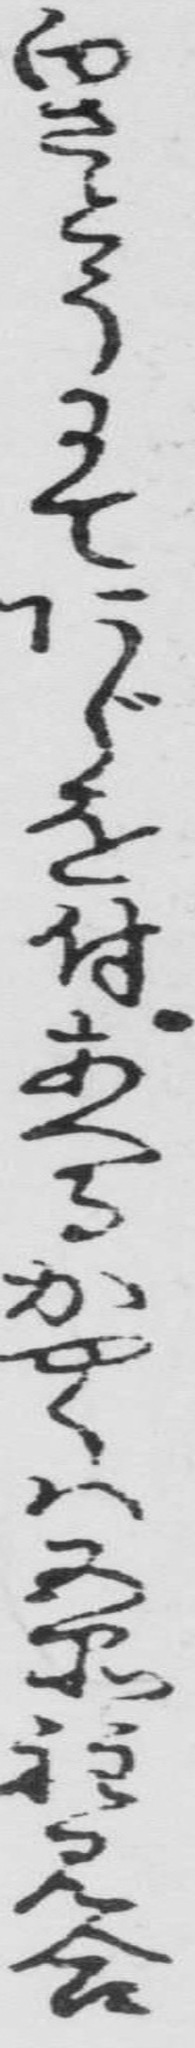白さとうにてあじを付、あへるかやくは五品程見合
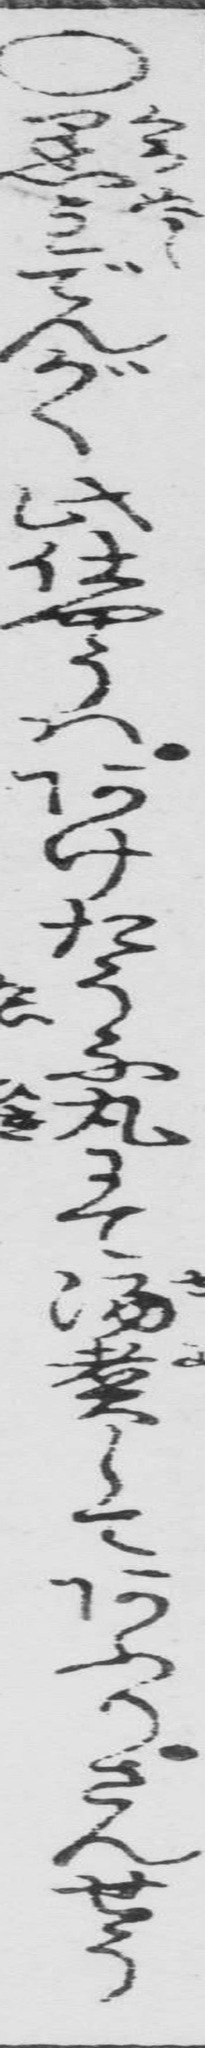○黒主でんがく此仕やうは、あけたうふ○にて湯煮してあふり、さんせう
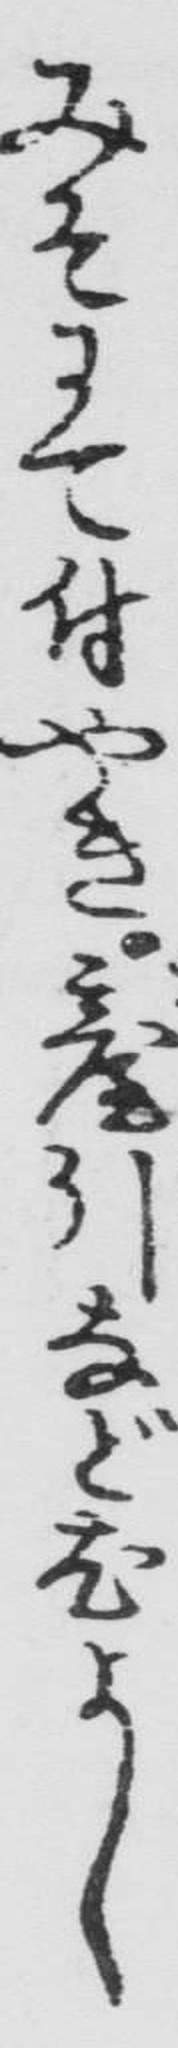みそにて付やき、台引など尤よし
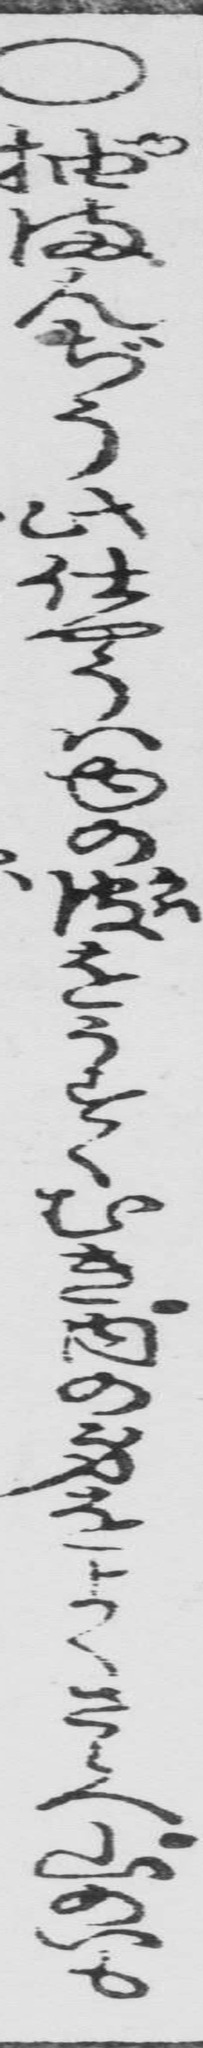○柚まんぢう此しやうはゆの皮をうすくむき、内の身をよくさらへ、山のいも
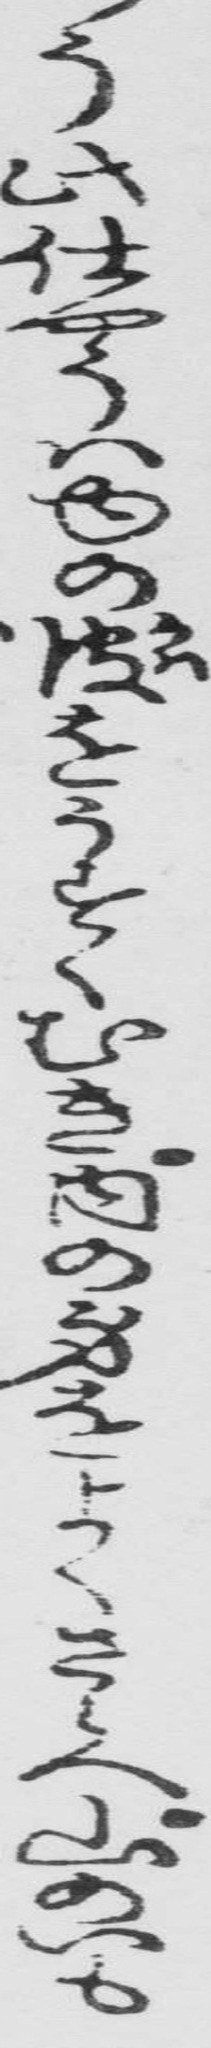○柚まんぢう此しやうはゆの皮をうすくむき、内の身をよくさらへ、山のいも
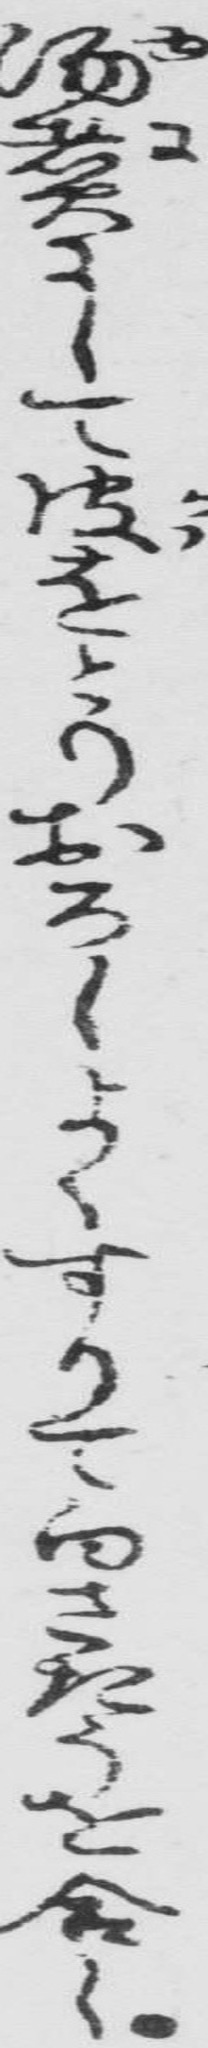湯煮して皮をとりおろしよくすりて白さたうを合し、
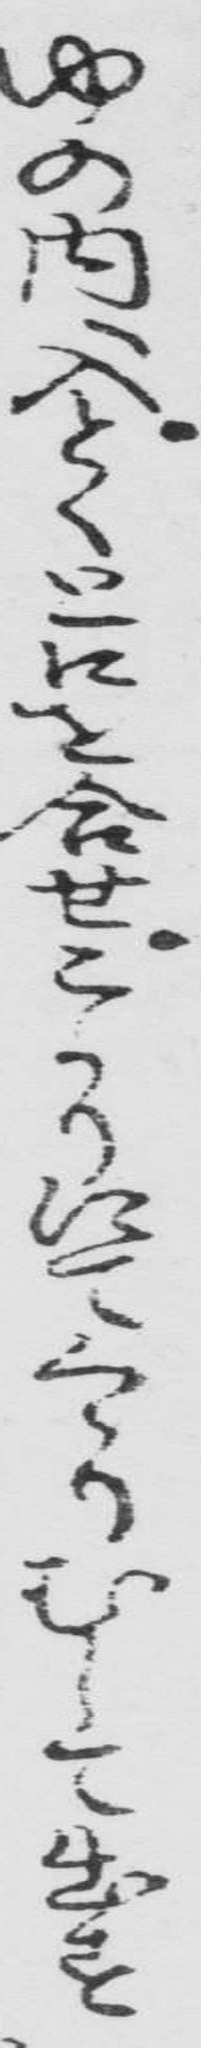ゆの内へ入、とくと口を合せ、こよりにてくゝりむして出す
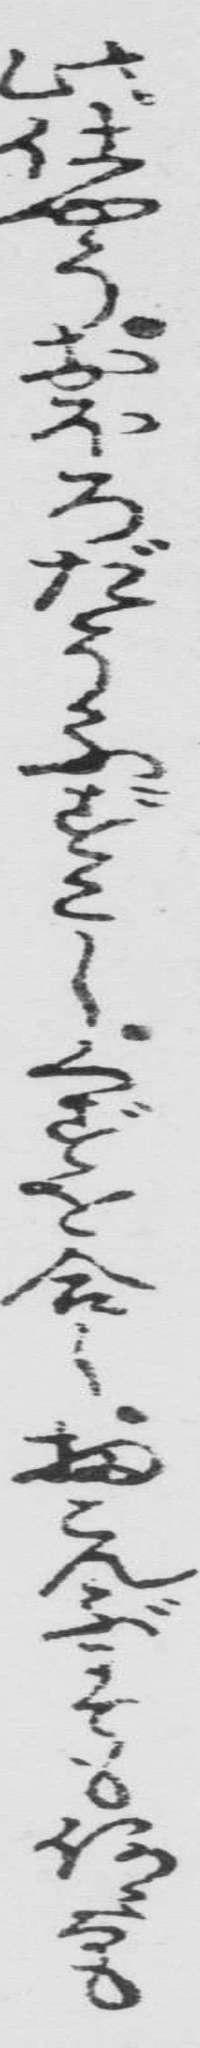○茶碗蒸此仕やう、おほろだうふにすこし、くずを合し、扨こんぶにても何にても
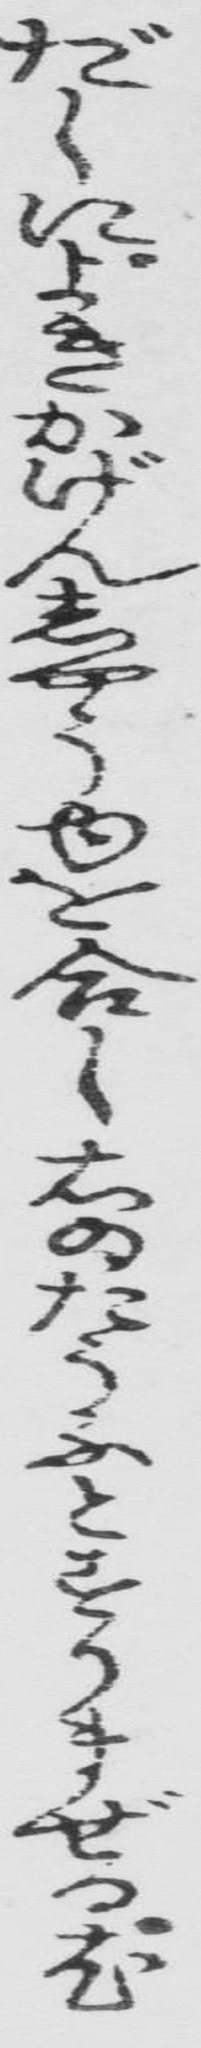だしに、よきかげんしやうゆを合し右のたうふとすりまぜる、尤
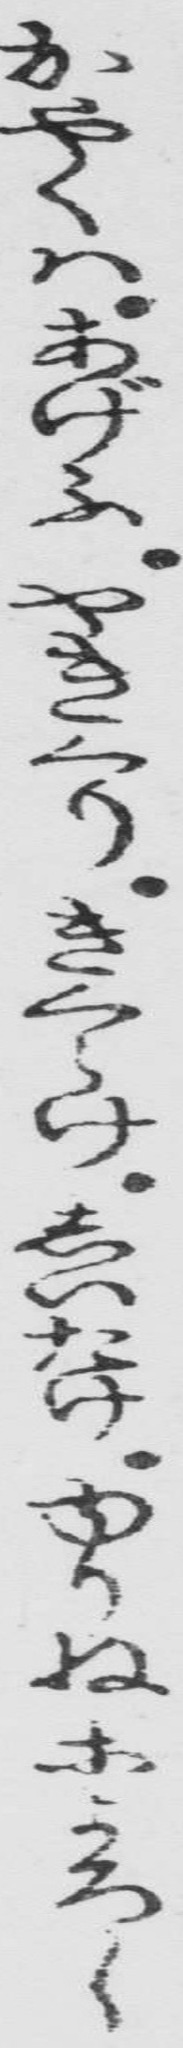かやくは、あげふ、やきくり、きくらけ、しいたけ、ゆりね等よろし
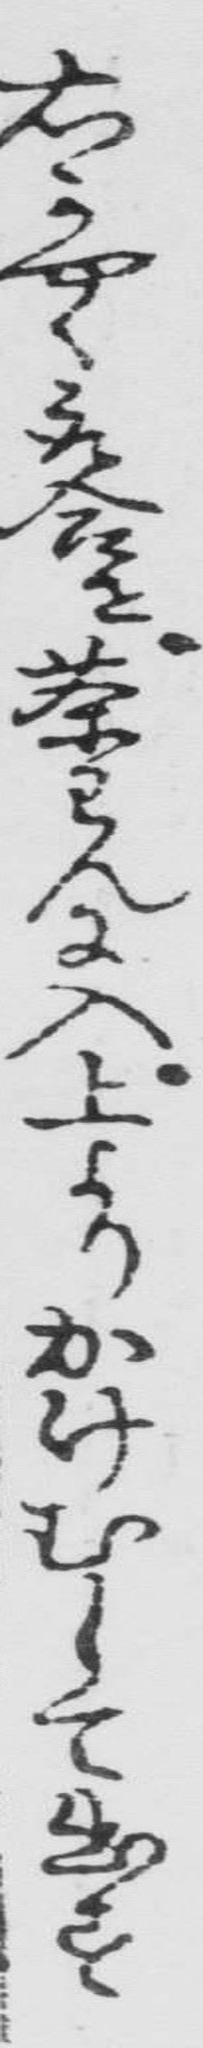右かやく取合を、茶わんに入、上よりかけむして出す
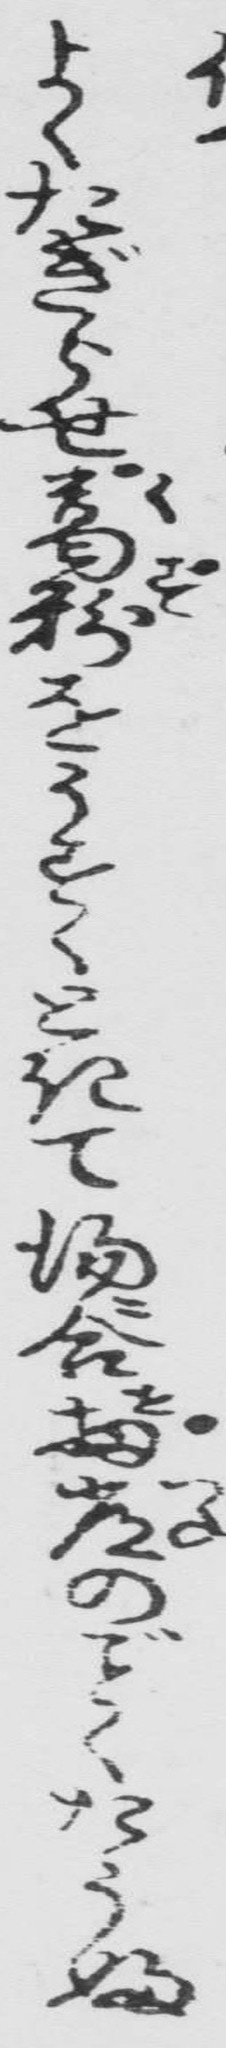よくたぎらせ、葛粉をうすくときて湯に合せ、扨常のごとくたうふ
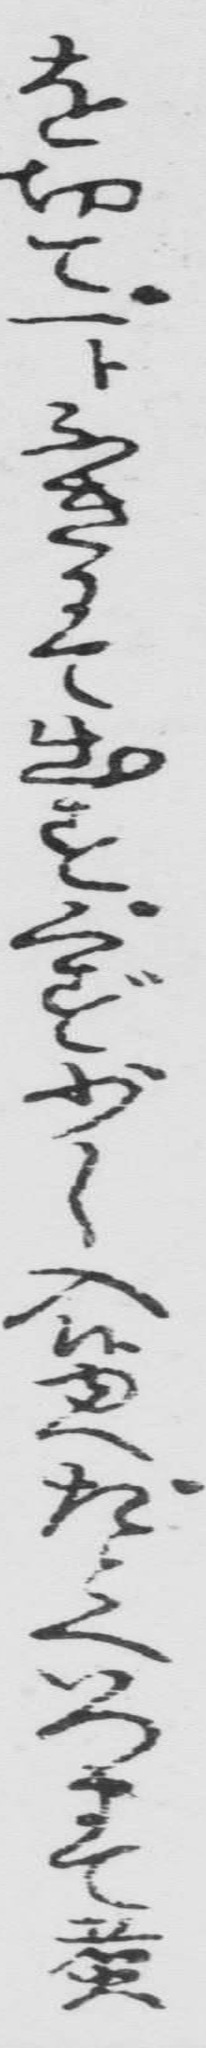を切て、一とふきにて出す、くず少し入候ゆへ、たとへいつまて煮
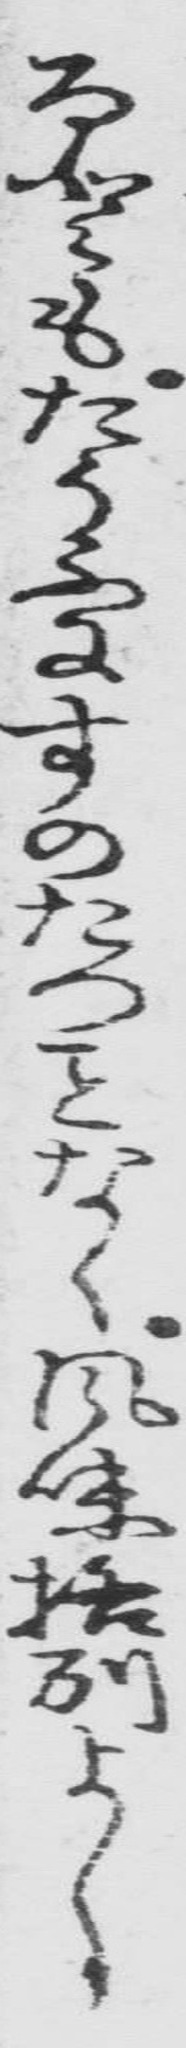るとも、たうふにすのたつことなし、風味格別よし

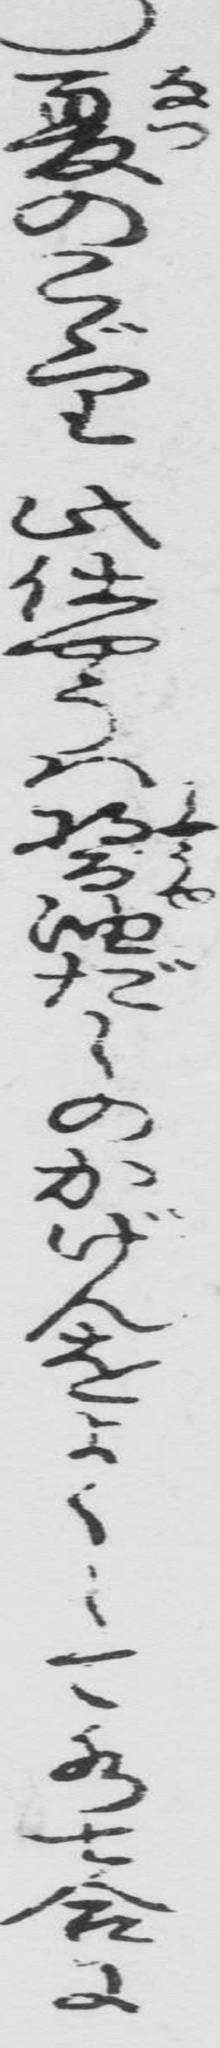○夏のこゞり此仕やうは醤油だしのかげんをよくして水七合に
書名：諸家通用/即席料理
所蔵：大阪府立大学学術情報センター 国文学研究資料館
